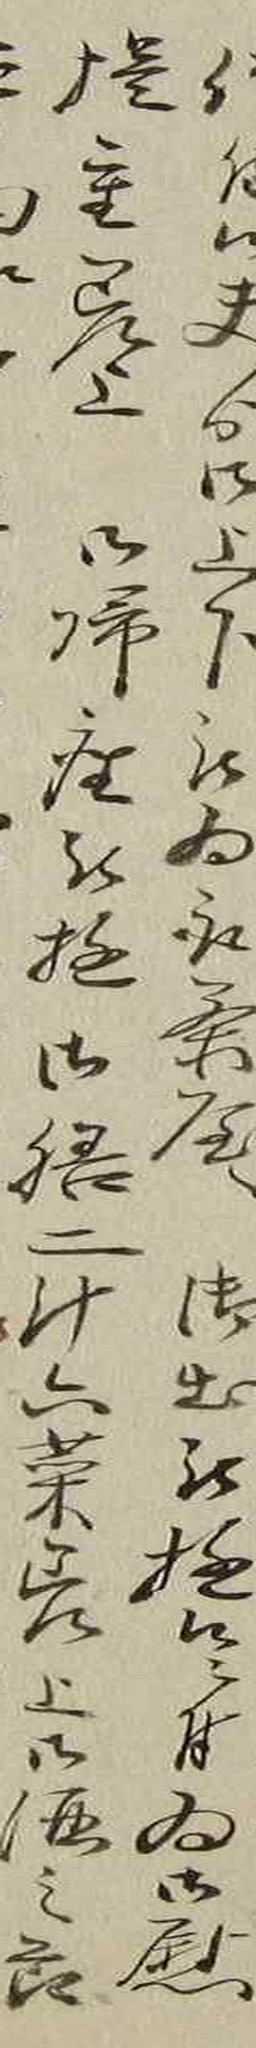提重差上御帰座被遊御膳二汁六菜差上御酒之節
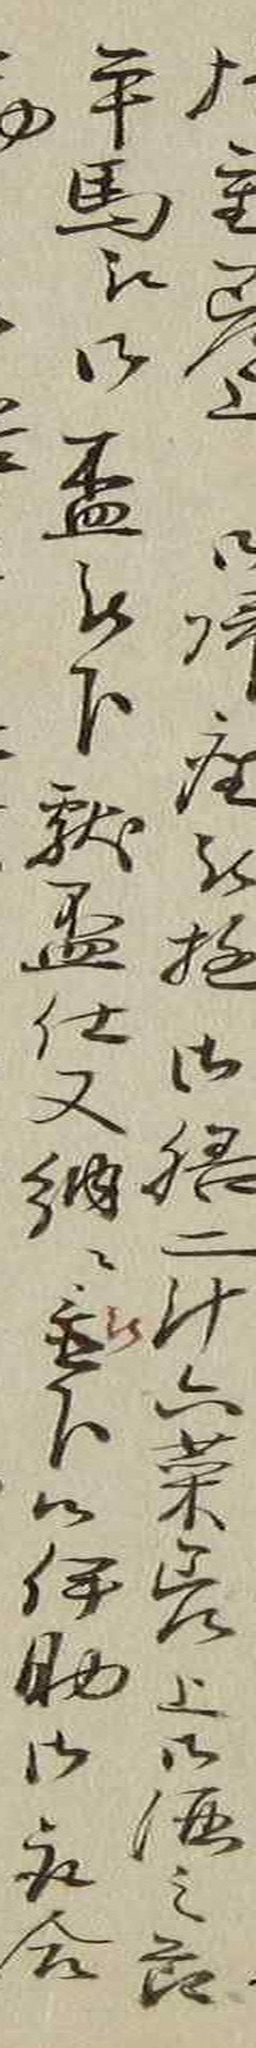平馬江御盃被下献杯仕又納に置下候伊助御取合
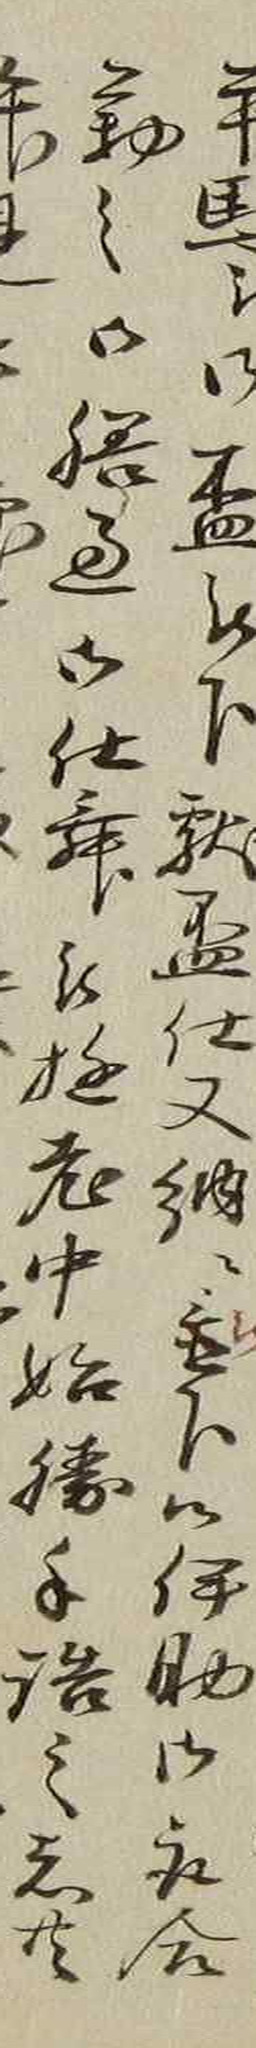勤之御膳過御仕舞被遊老中始勝手詰之者共
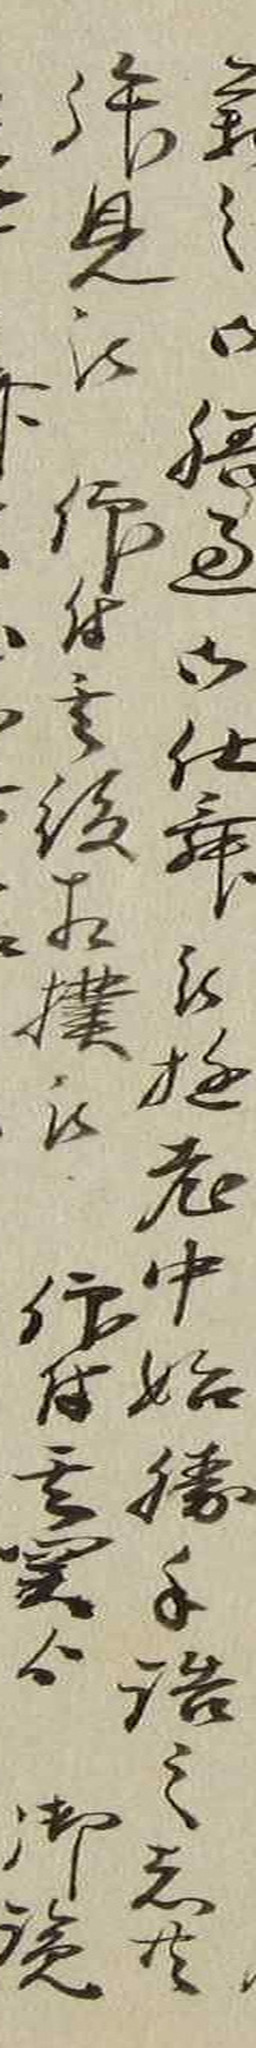拝見被仰付其後相撲被仰付其関ゟ御覧
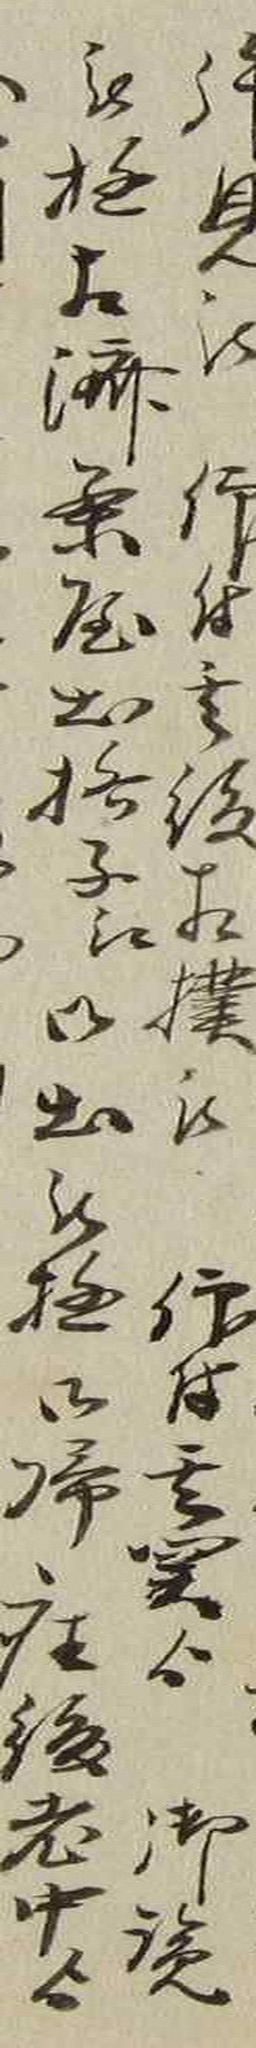被遊相済茶屋出格子江御出被御帰座後老中ゟ
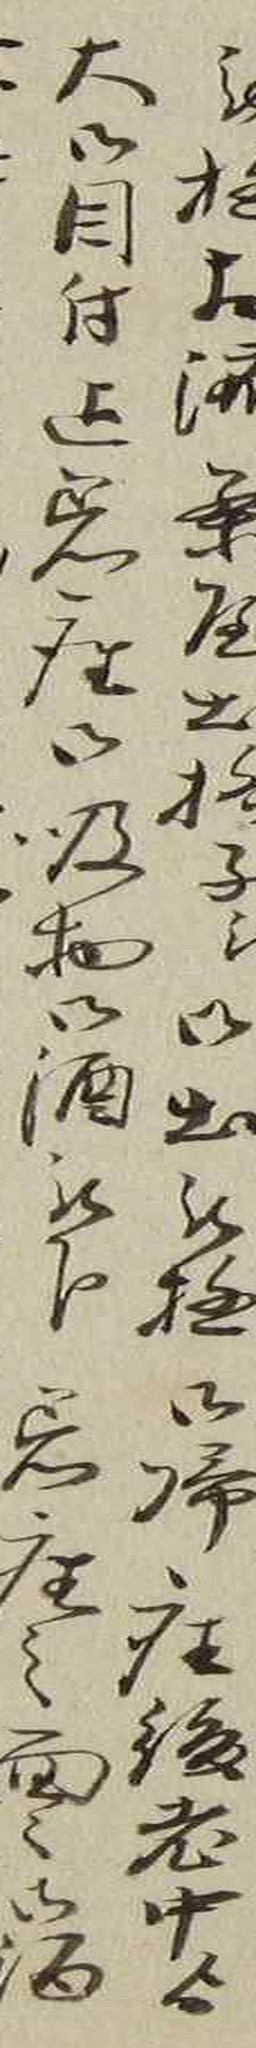大御目付迄着座御吸物御酒被下着座之面々御酒
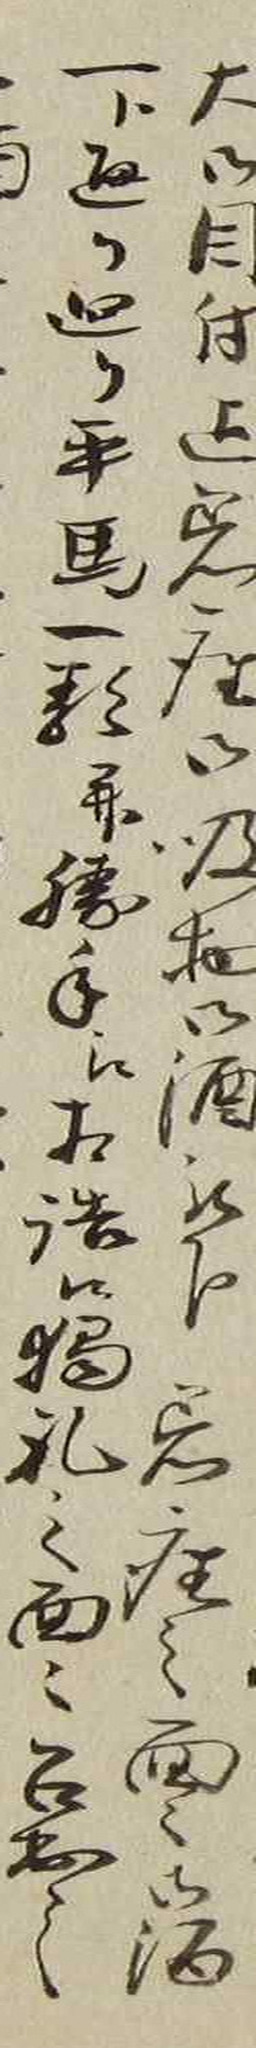一ト廻り平馬一類并勝手江相詰候独礼之面々召出之
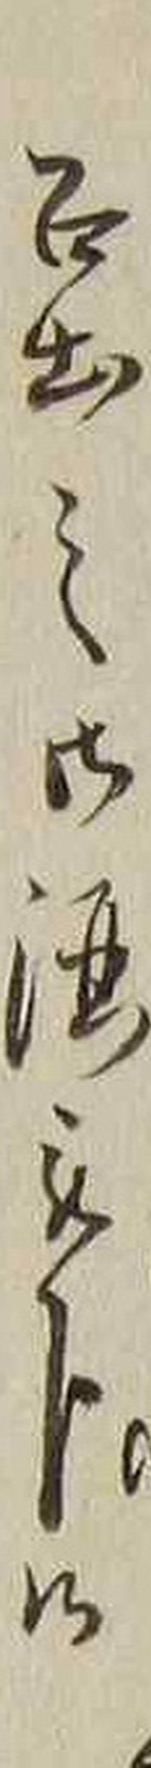召出之御酒被下侯
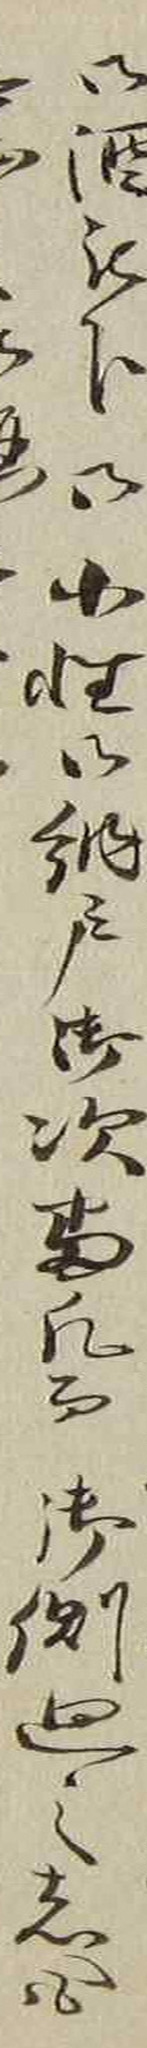御酒被下御小性御納戸御次番凡而御側廻之者へも
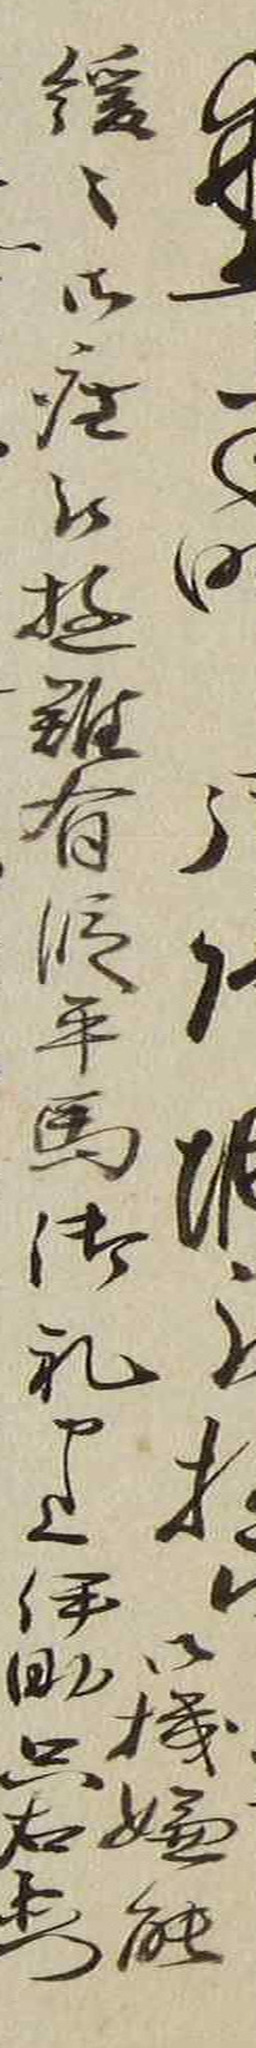緩々御座被遊難有段平馬御礼申上伊助只右衛門
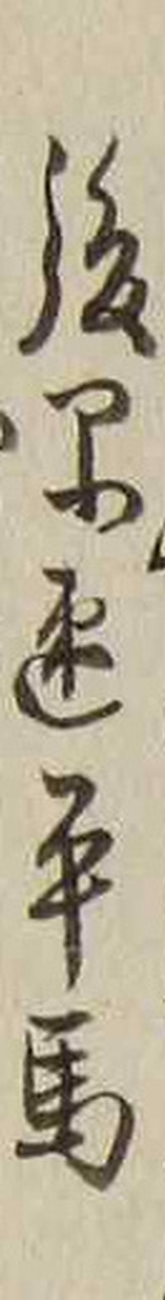後早速平馬
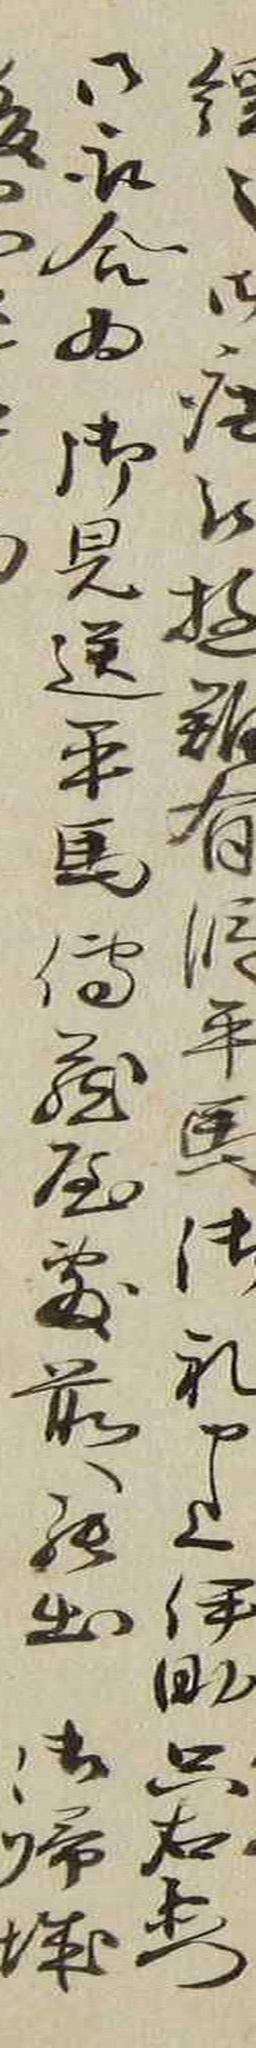御取合為御見送平馬色平馬伝蔵屋敷前へ罷出御帰城
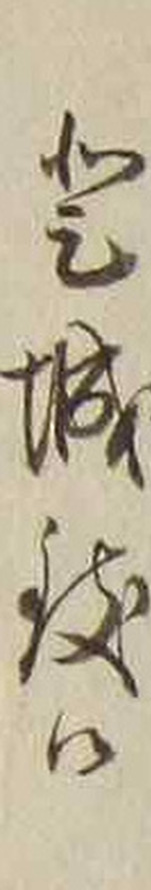登城致候

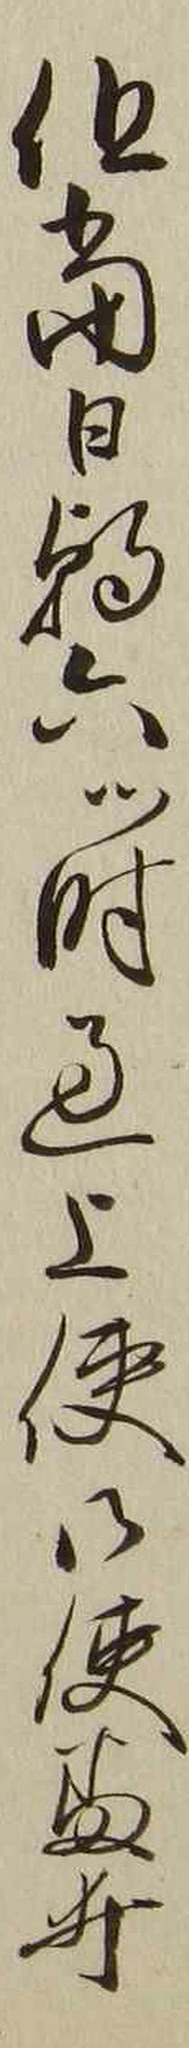但当日朝六ツ時過上便御使番井
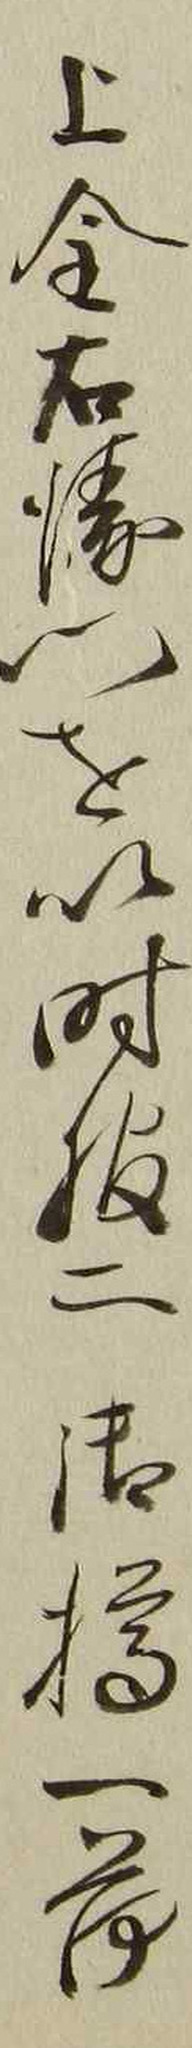上金右衛門を以時服二御樽一荷
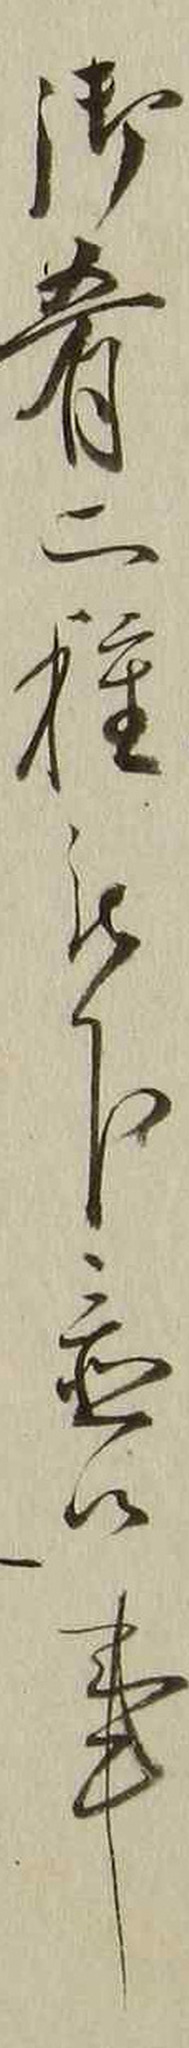御肴二種被下置候事
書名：諸士系譜　巻之103　か之部11
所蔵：会津若松市立会津図書館
